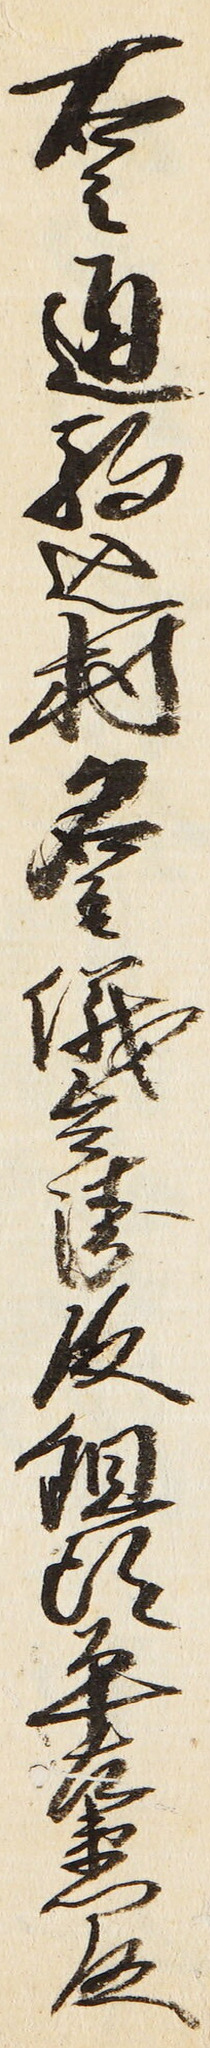右之通駒込村名主儀兵衛殿組頭平左衛門殿
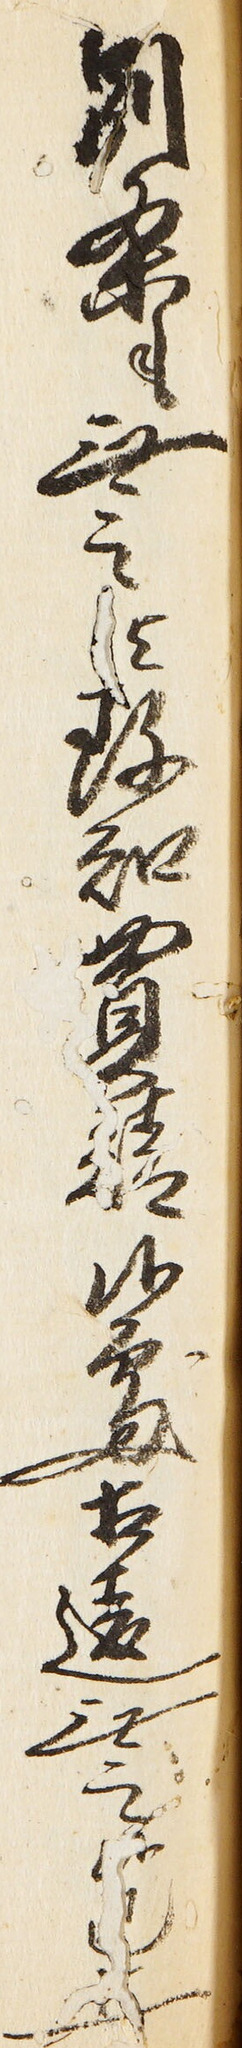別条も無之与存知買請候処相違無之候已上
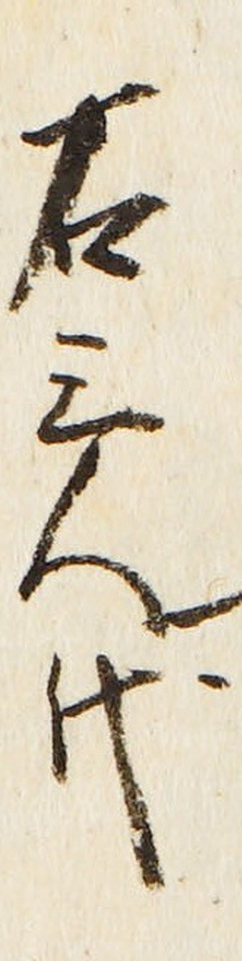右三人代

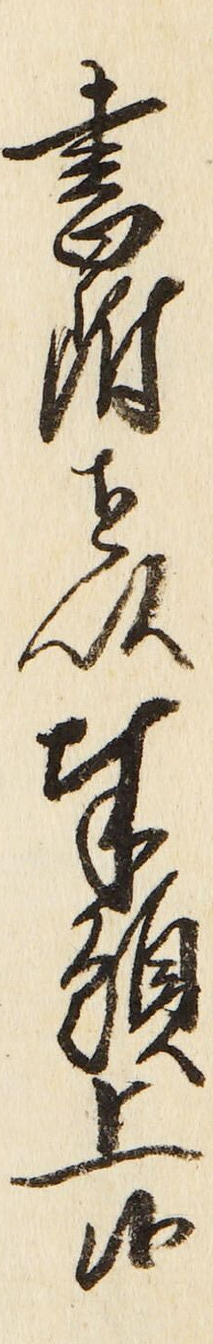書付を以奉願上候
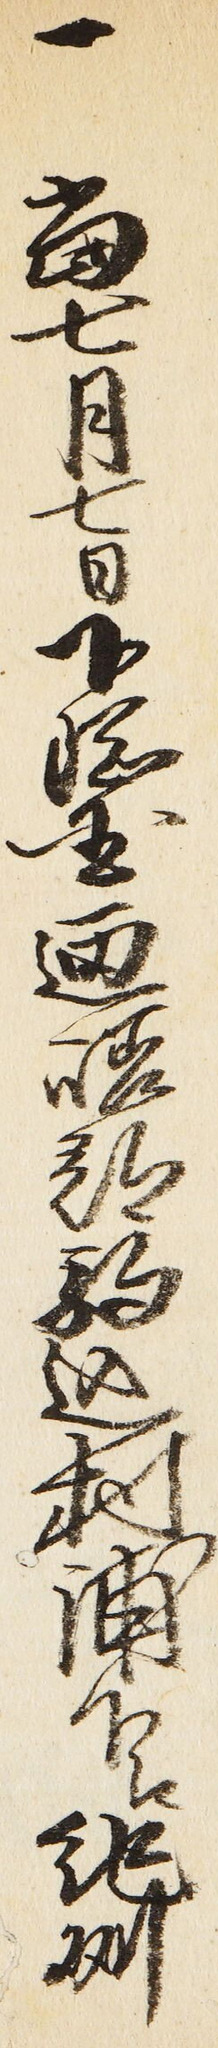一当七月七日下総国匝瑳郡駒込村浦下江紀州
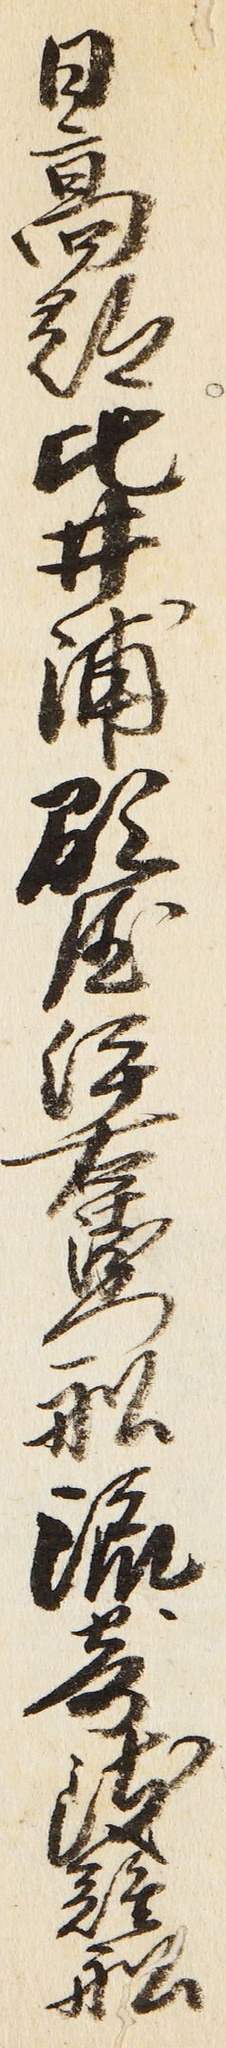日高郡比井浦顕屋伊右衛門船流寄致難船
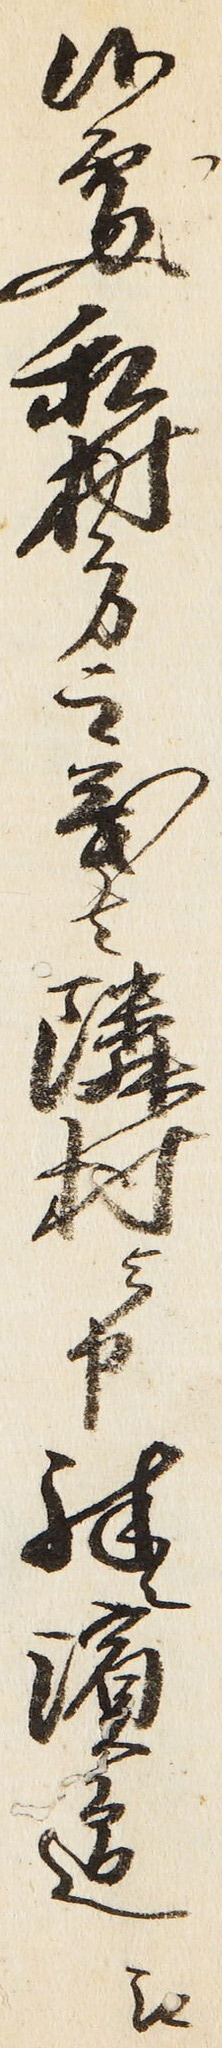候処私村方之義者隣村与申殊ニ浜辺江
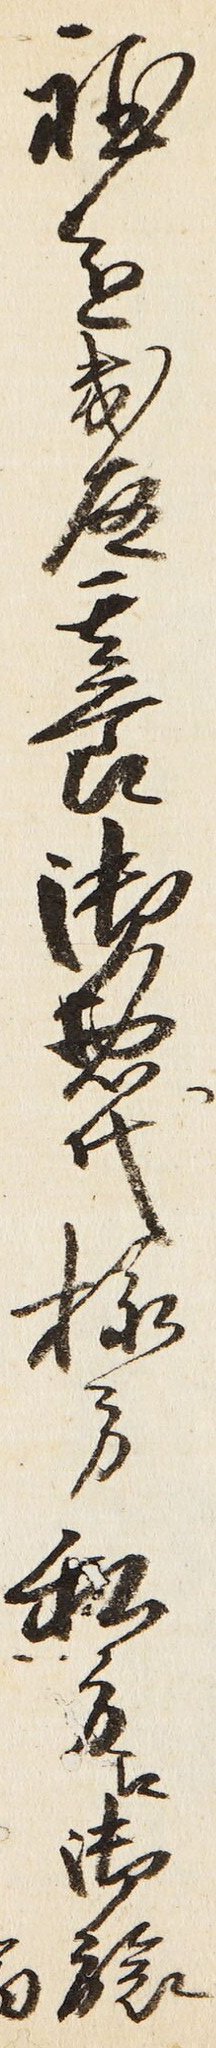程近き故其節御惣代様方私方江御旅宿
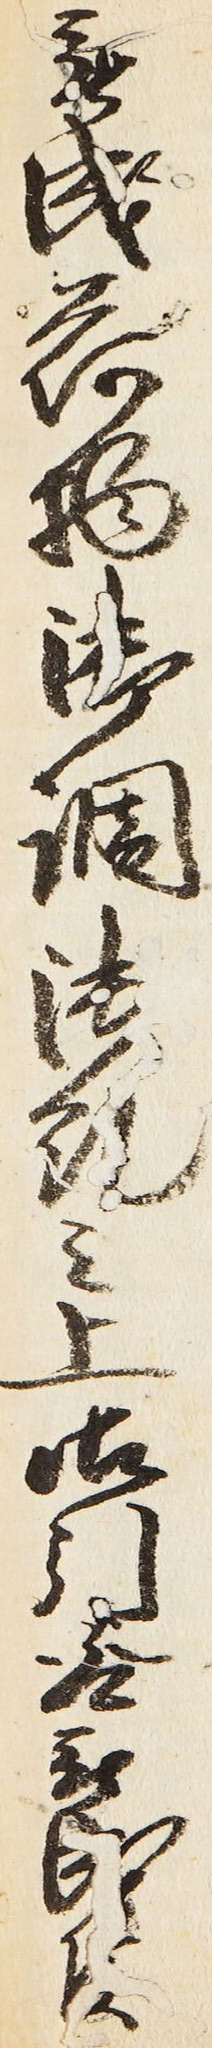被成荷物御調御糺之上御引取被成候
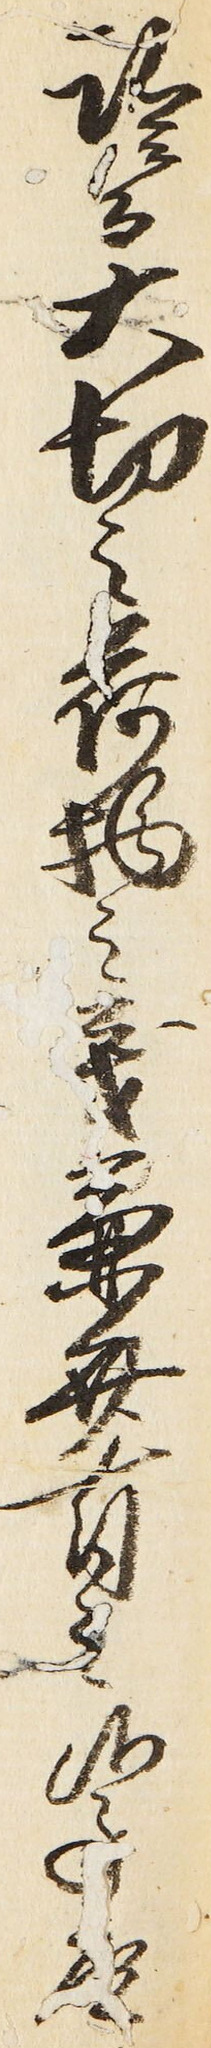跡ニ而大切之荷物之義兼弁有之候
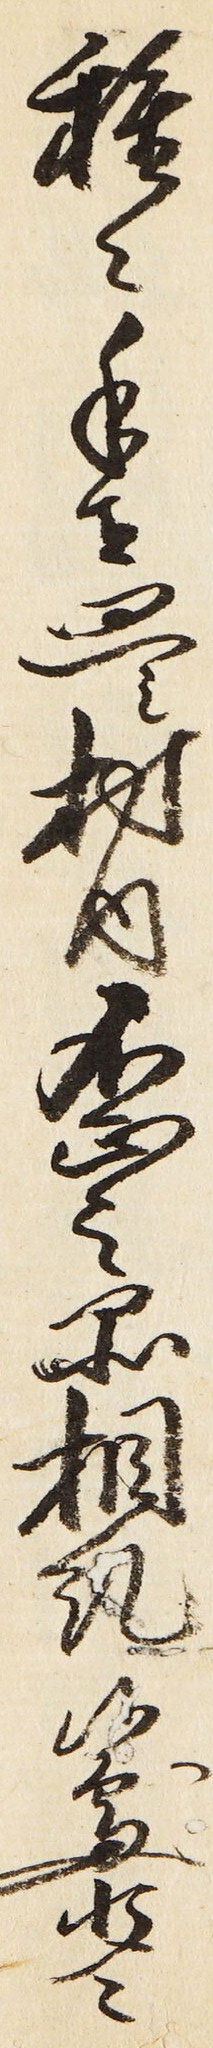種々手を廻シ村内不正之品相糺候処少々
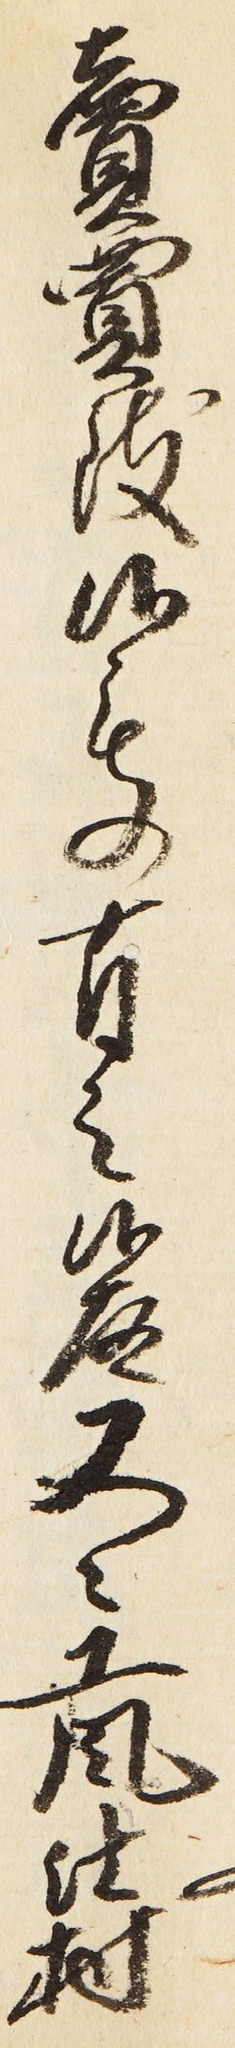売買致候もの有之候故又々工風仕村
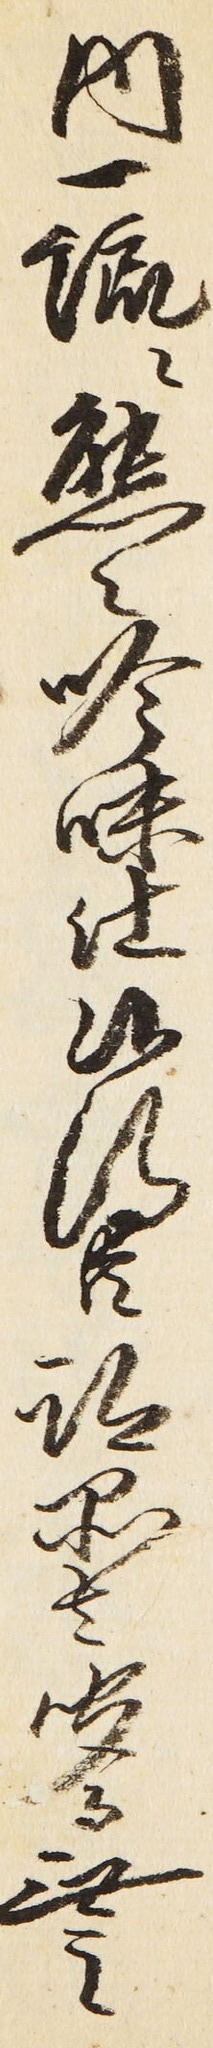内一統ニ態々吟味仕候得共跡品者聞而無之
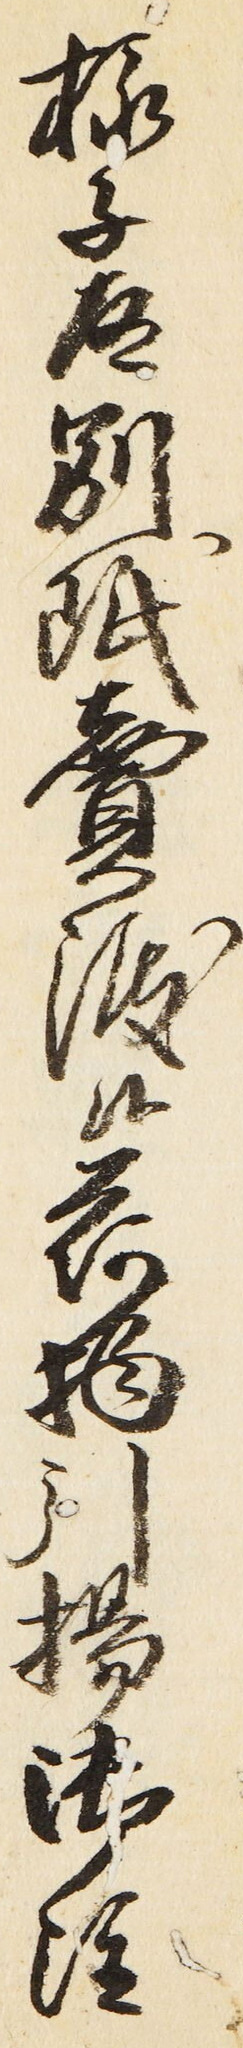様子故別紙売渡候荷物引揚御注
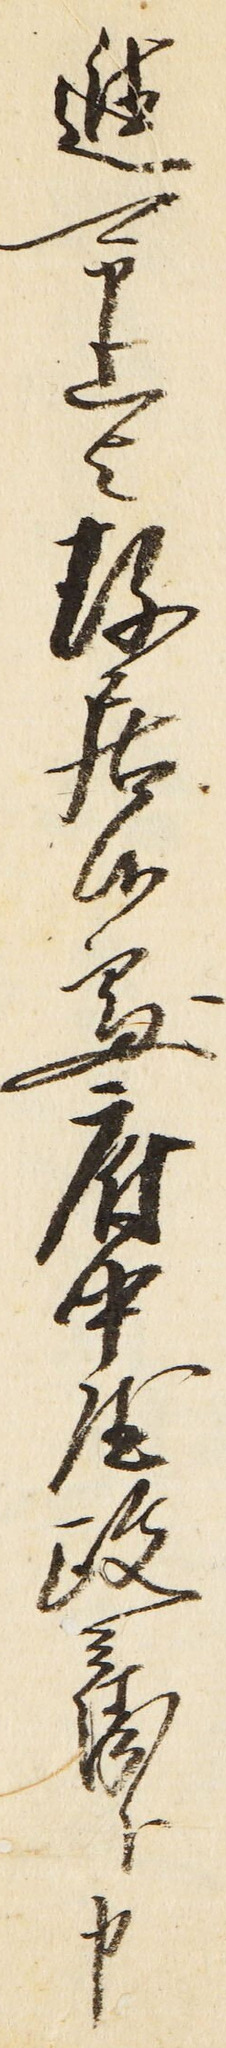進可申上与存居候処府中屋政兵衛ト申
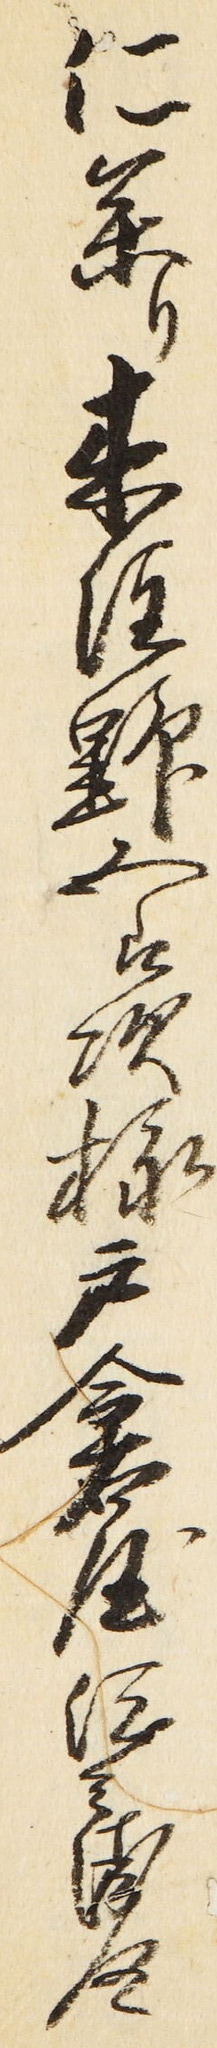仁参り来住野五郎次様戸倉屋伊兵衛殿
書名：難船一件記録
